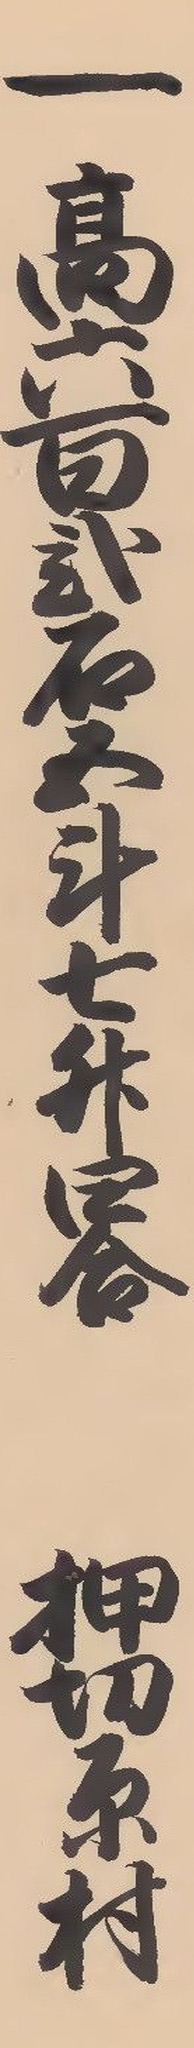一高六百弐石五斗七升四合押切原村
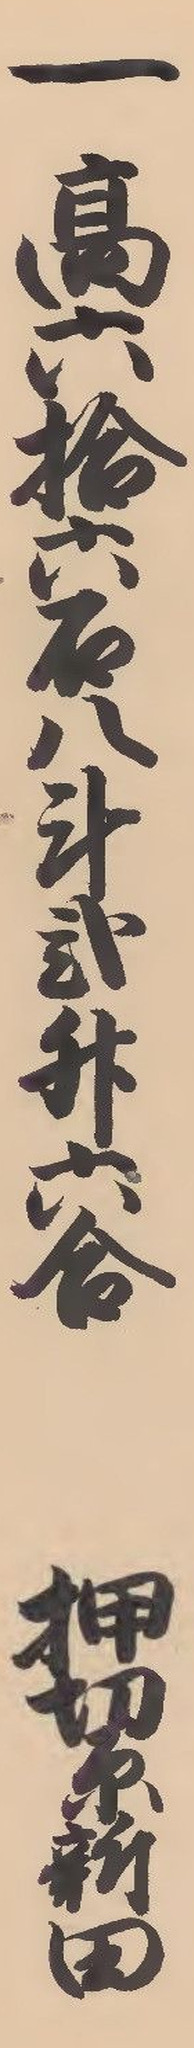一高六拾六石八斗弐升六合押切原新田

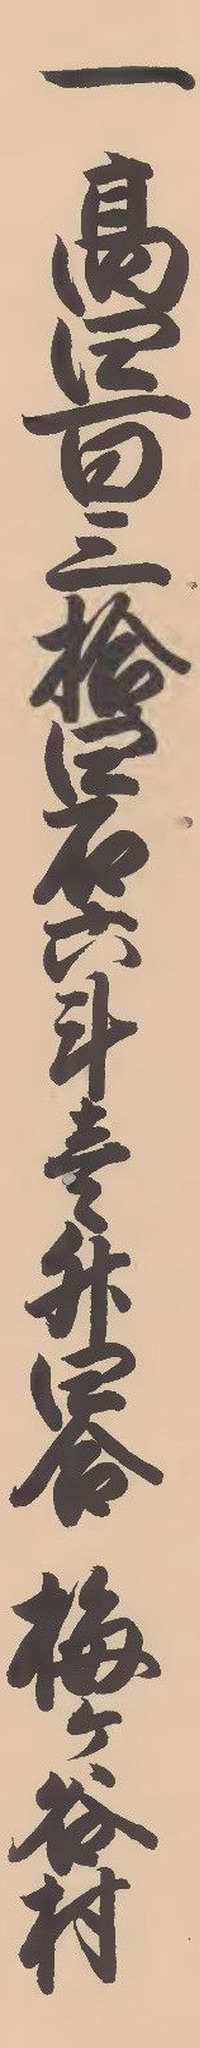一高四百三拾四石六斗壱升四合梅ヶ谷村
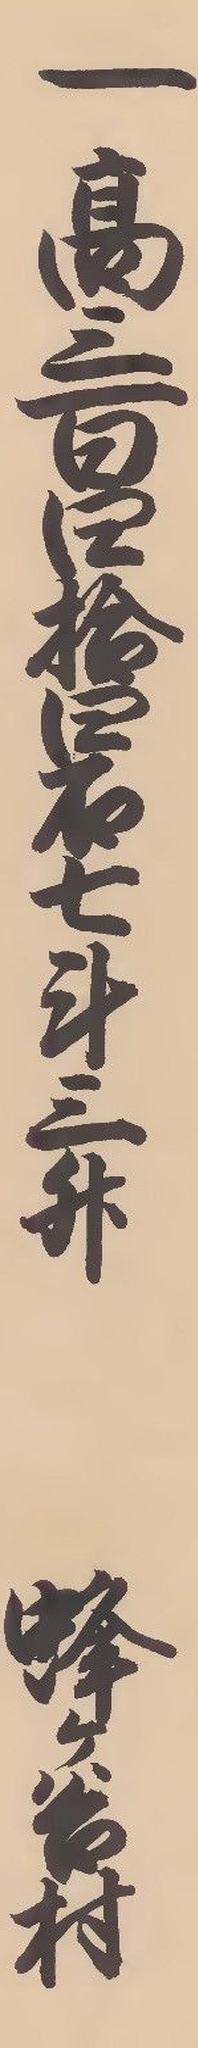一高三百四拾四石七斗三升蜂ヶ谷村
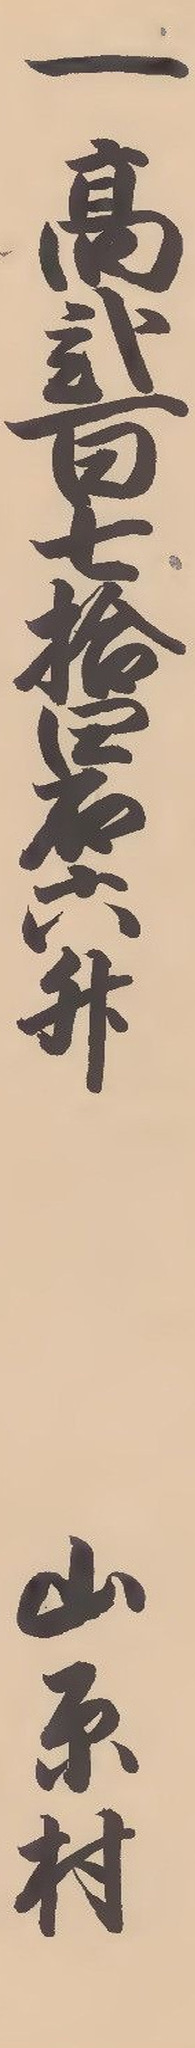一高弐百七拾四石六升山原村
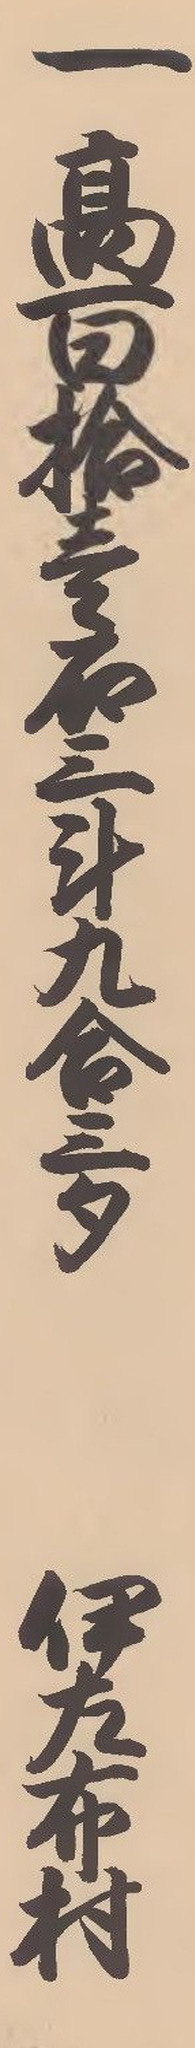一高百拾壱石三斗九合三勺伊左布村
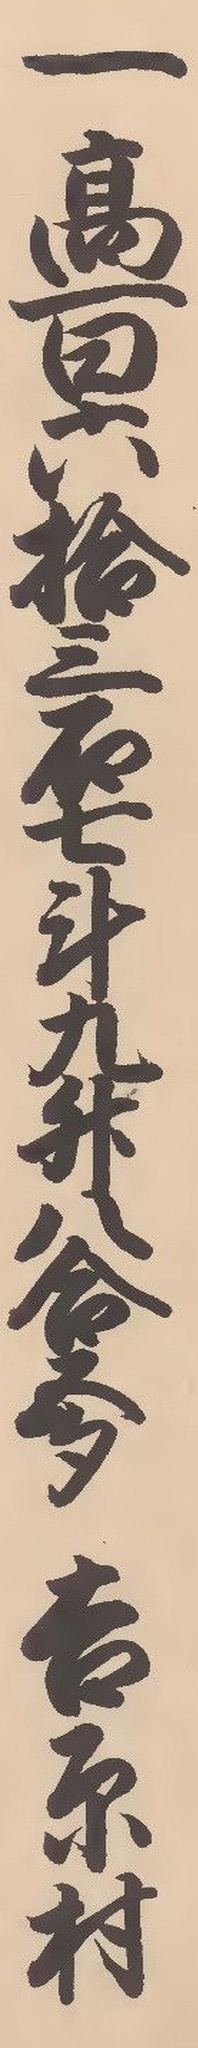一高百六拾三石七斗九升八合五勺吉原村
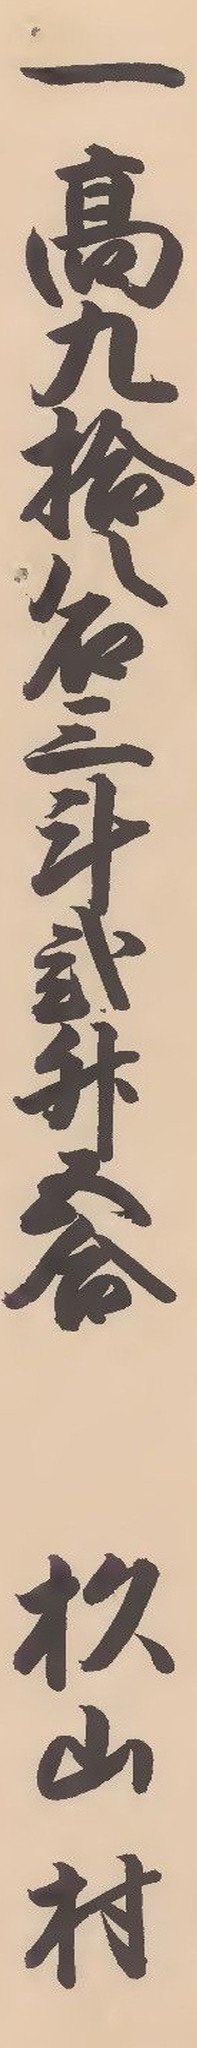一高九拾八石三斗弐升五合杉山村
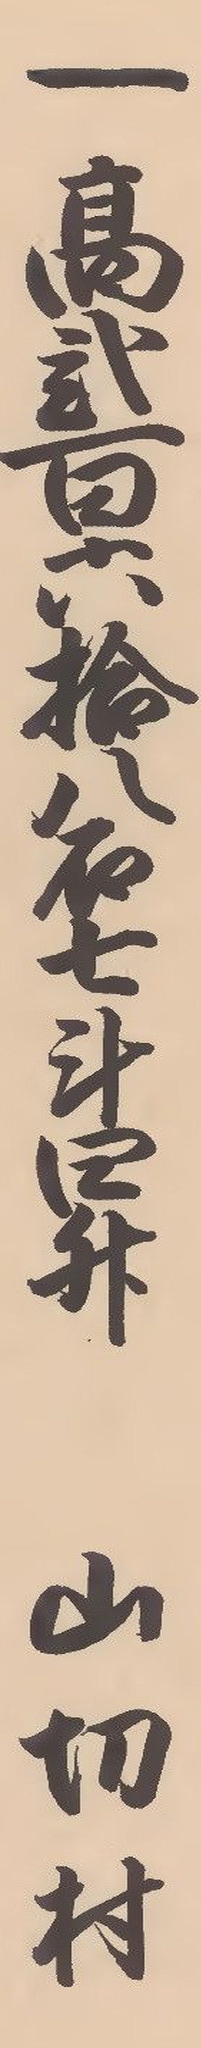一高弐百六拾八石七斗四升山切村
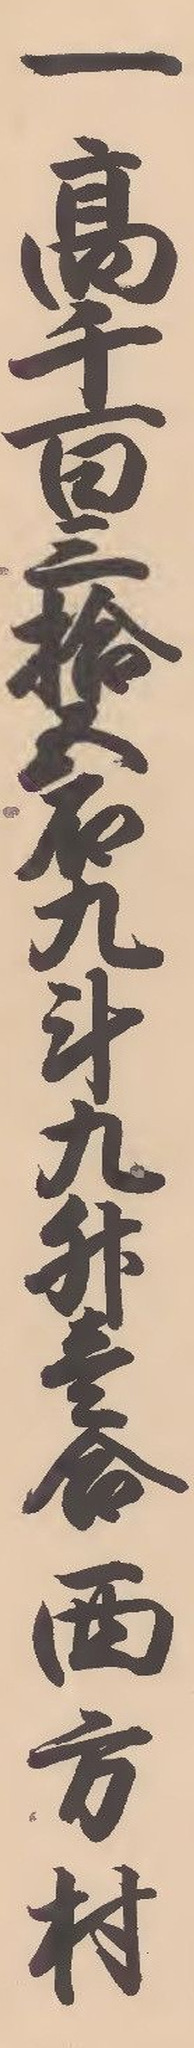一高千百三拾五石九斗九升壱合西方村

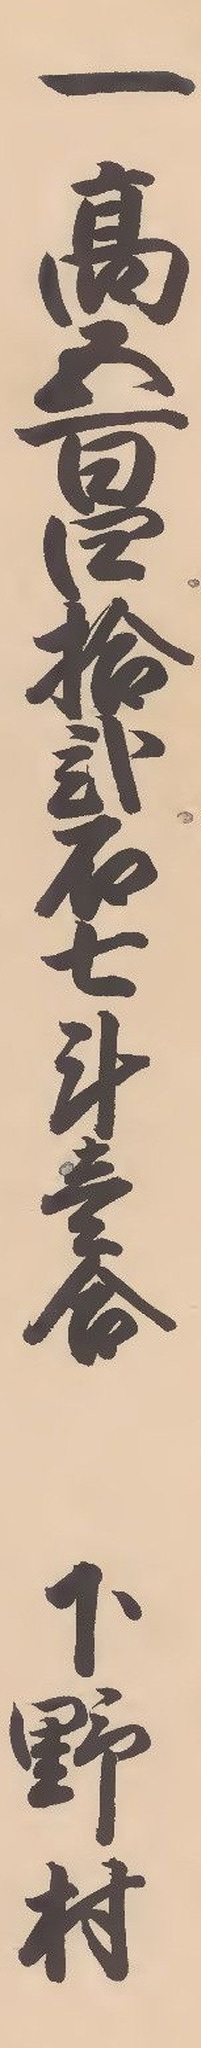一高五百四拾弐石七斗壱合下野村
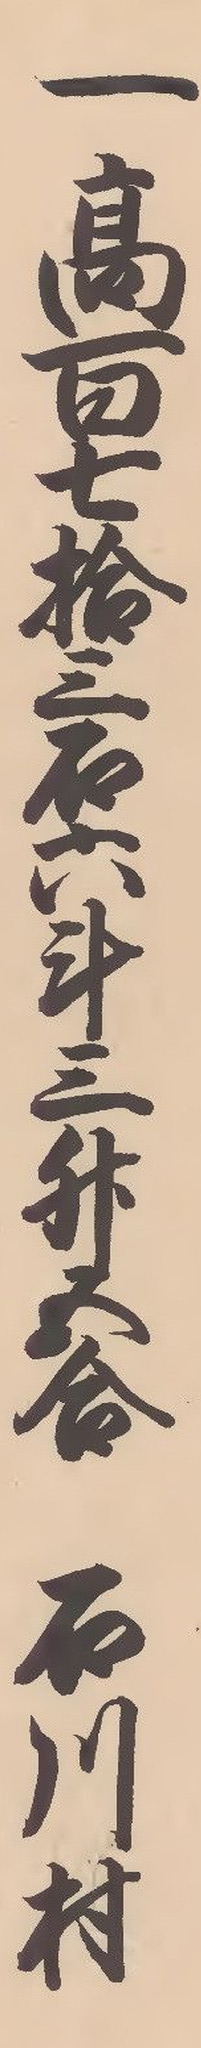一高百七拾三石六斗三升五合石川村
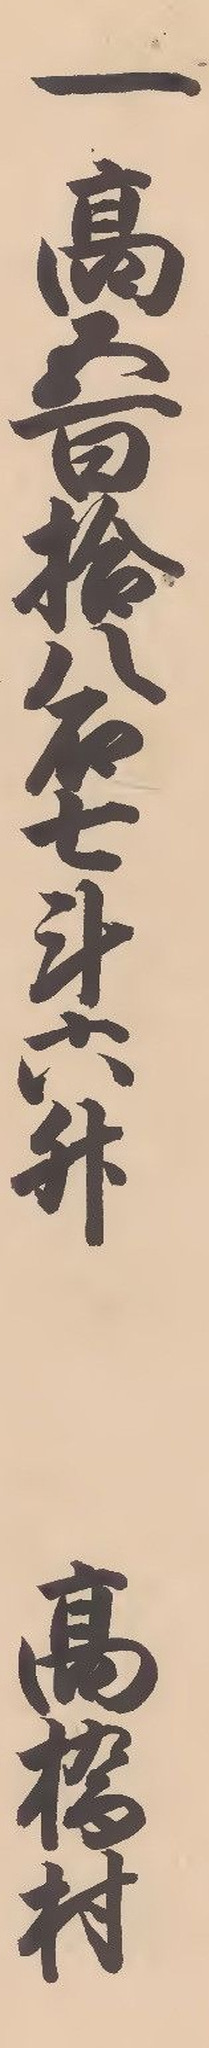一高五百拾八石七斗六升高橋村
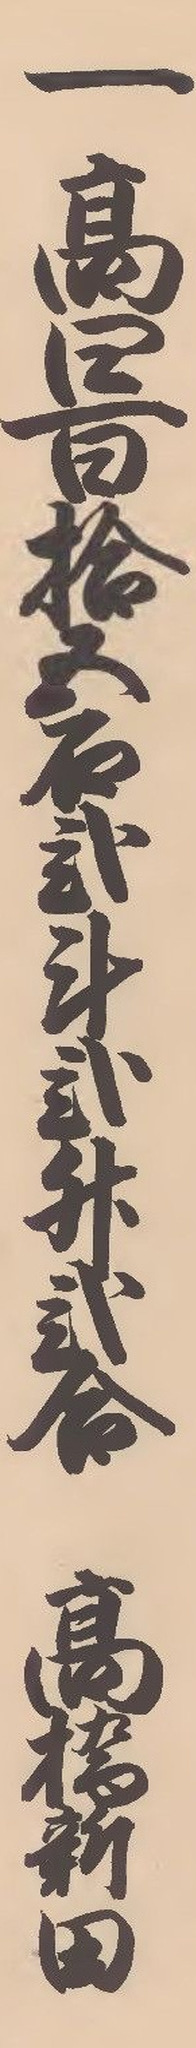一高四百拾五石弐斗弐升弐合高橋新田
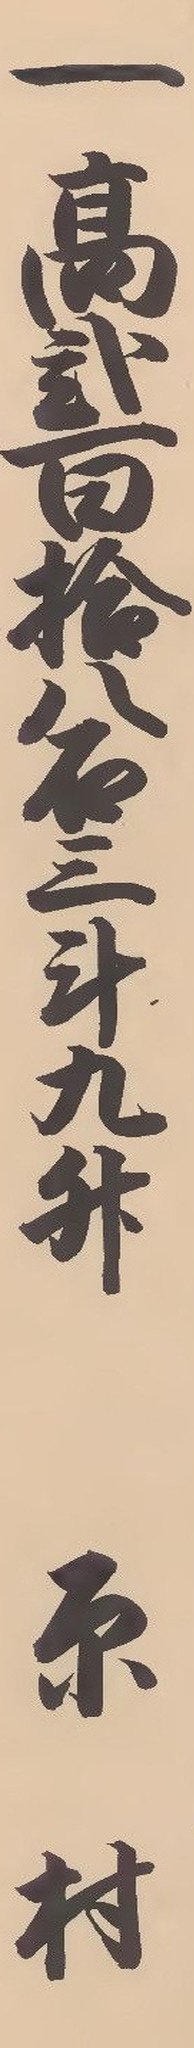一高弐百拾八石三斗九升原村
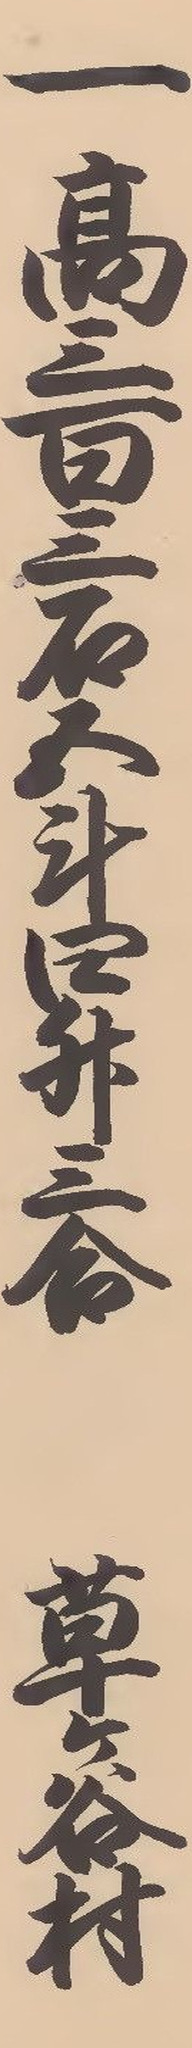一高三百三石五斗四升三合草ヶ谷村
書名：駿河国郷帳
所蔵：国立公文書館 National Archives of Japan
